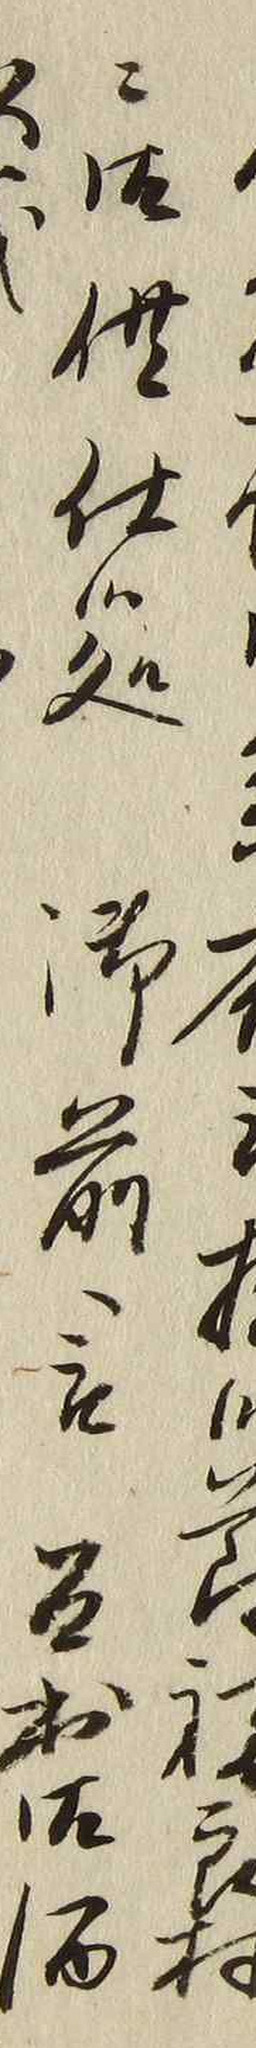々御供仕候処御前へ被召出御酒
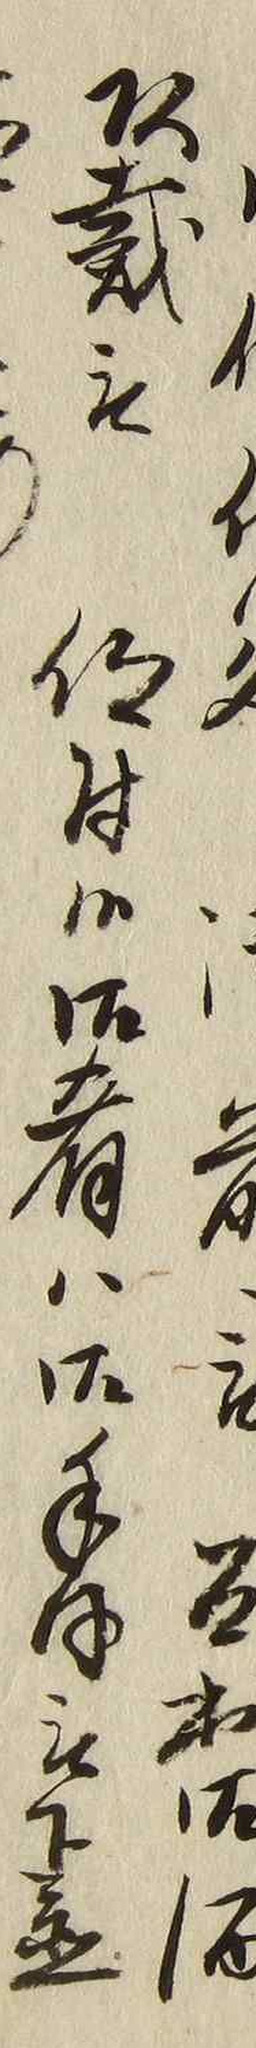頂戴被仰付候御肴ハ御手自被下置
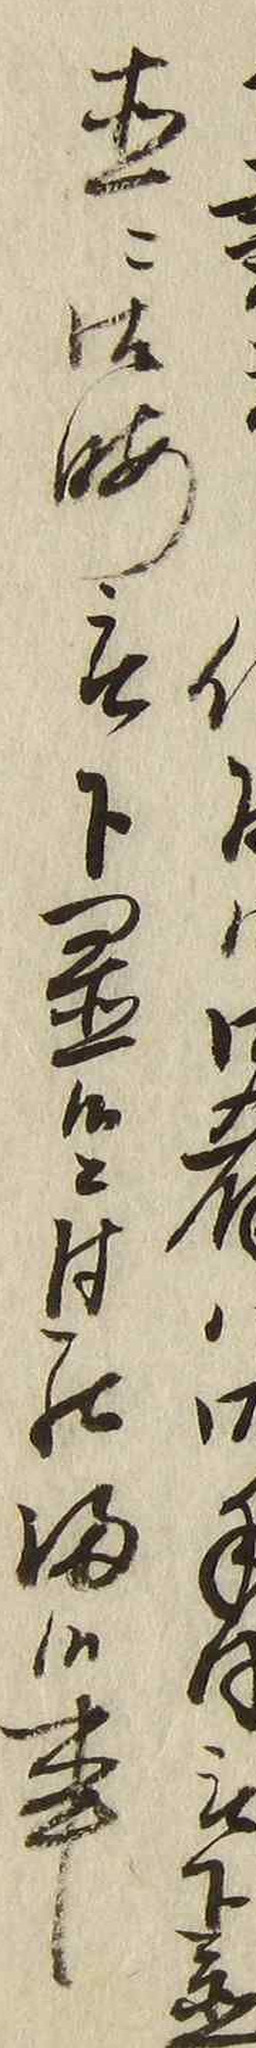直ニ御暇被下置候ニ付罷帰候事

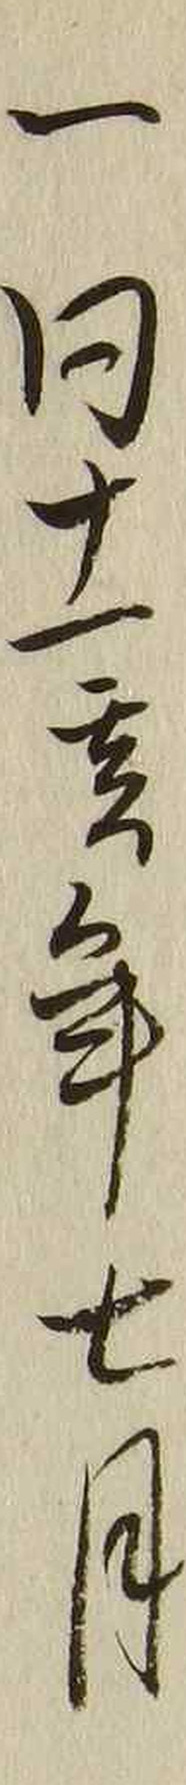一同十一亥年七月
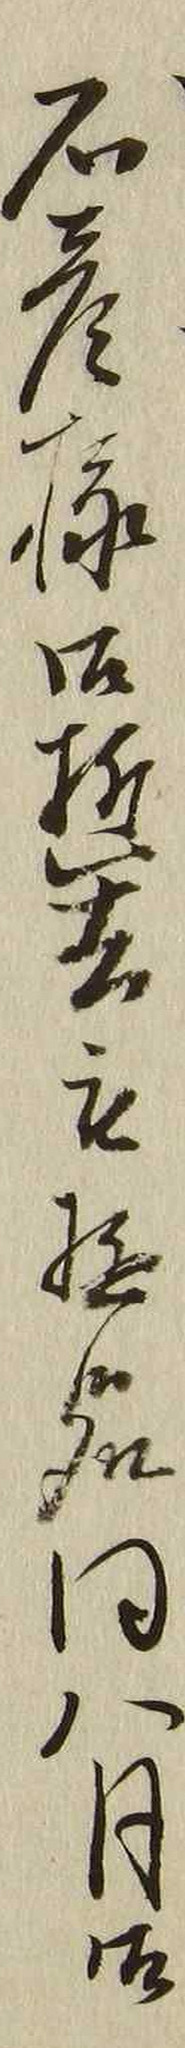石彦様御逝去被遊候処同八月御
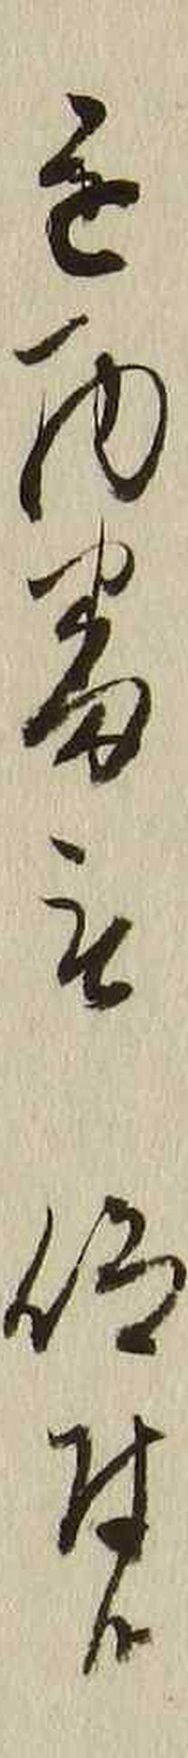進物番被仰付候
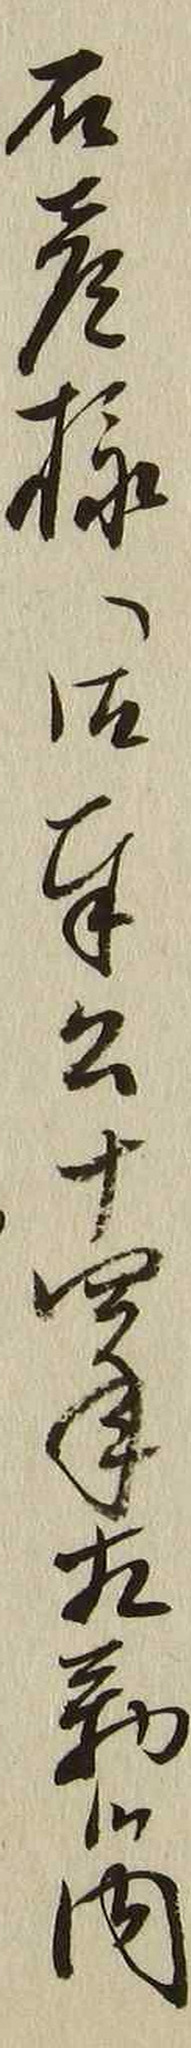石彦様へ御奉公十四年相勤候内
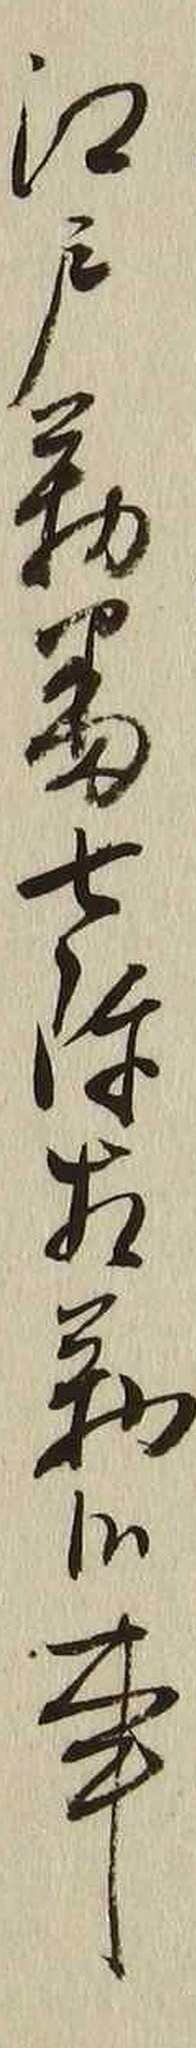江戸勤番七陣相勤候事
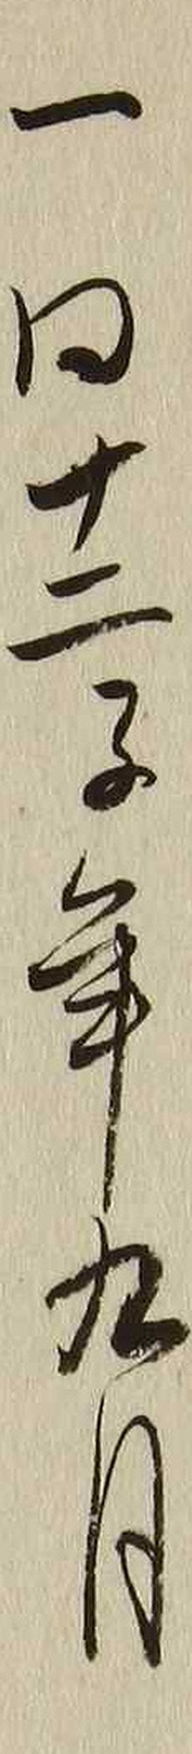一同十二子年九月
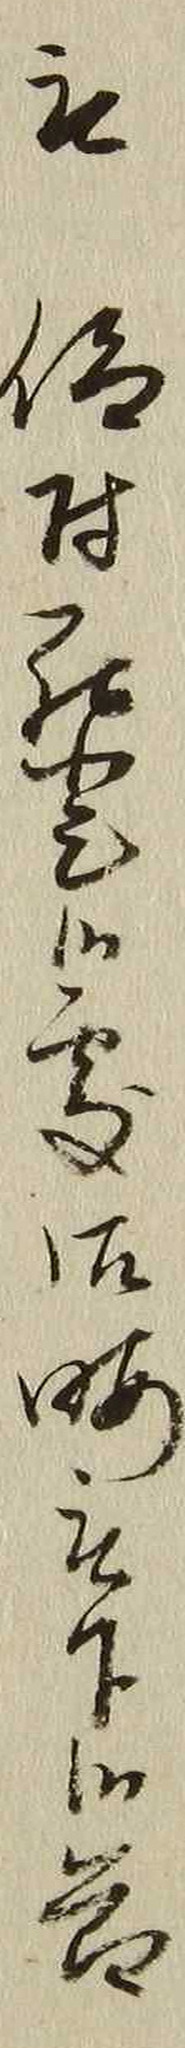被仰付罷登候処御暇被下候節
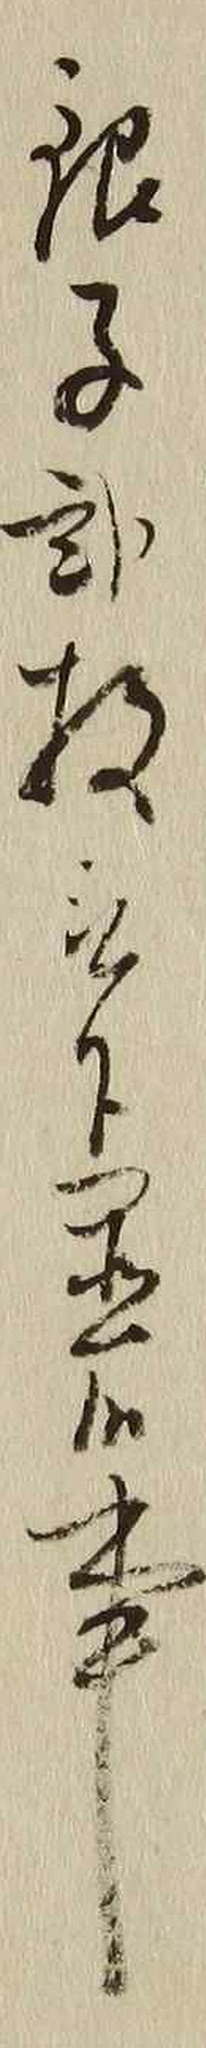銀子弐枚被下置候事
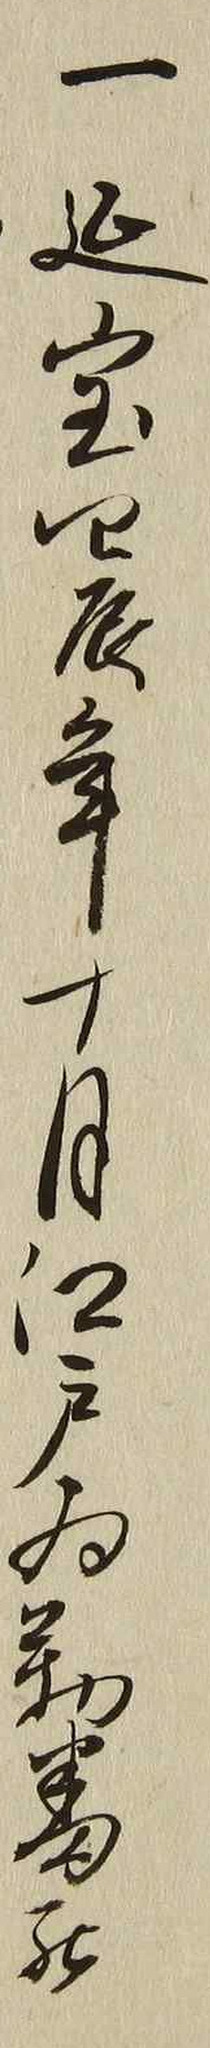一延宝四辰年十月江戸為勤番罷
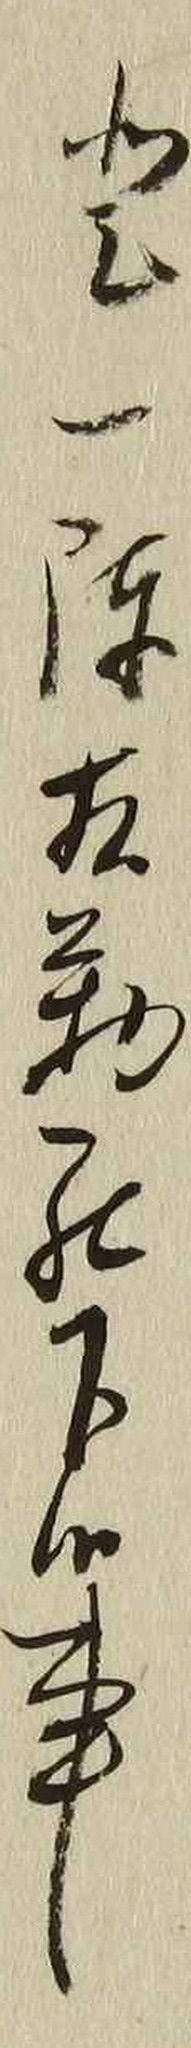登一陣相勤罷下候事
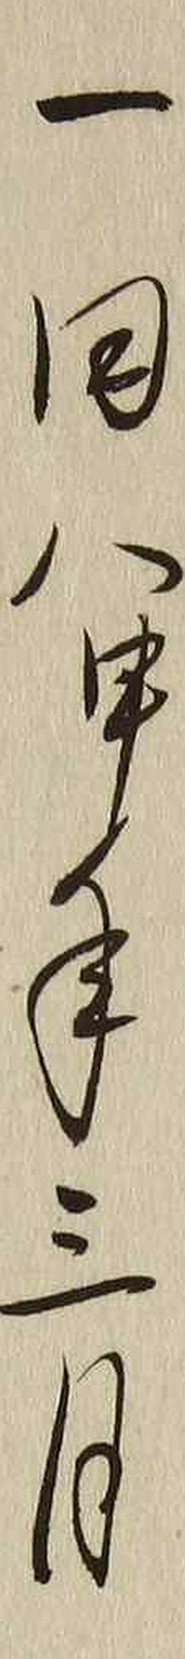一同八申年三月
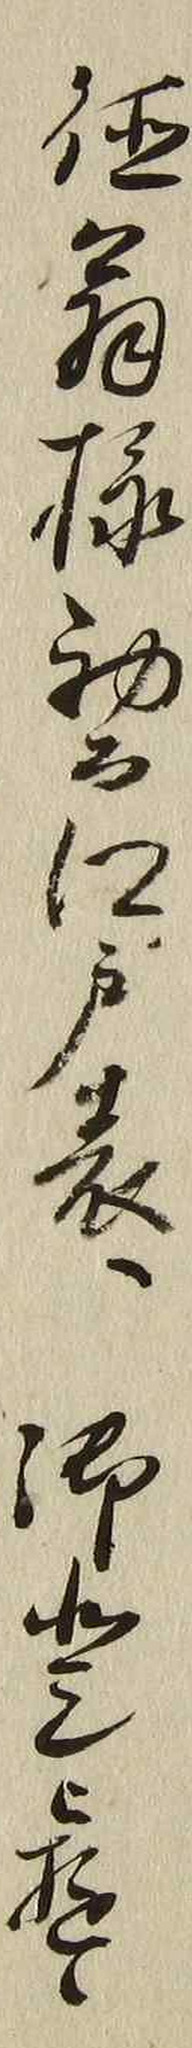徳翁様初而江戸表へ御登被遊候
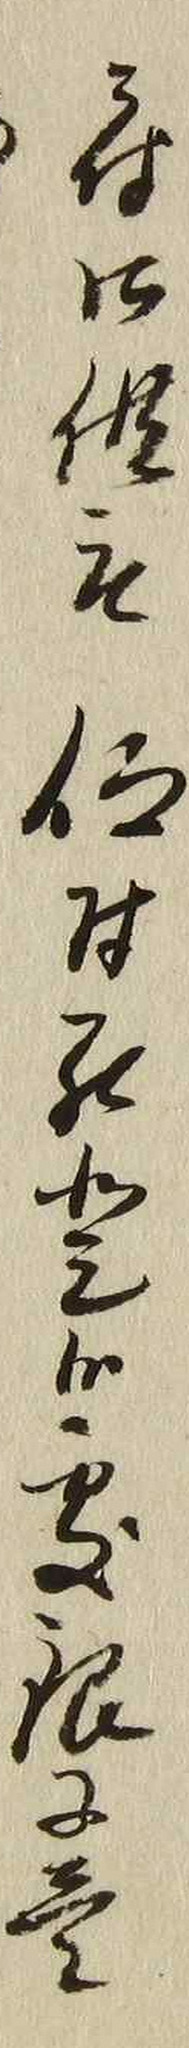ニ付御供被仰付罷登候処銀子壱
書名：諸士系譜　巻之348　も之部4
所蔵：会津若松市立会津図書館
